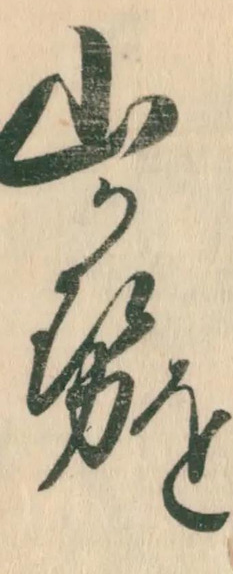山かせ」
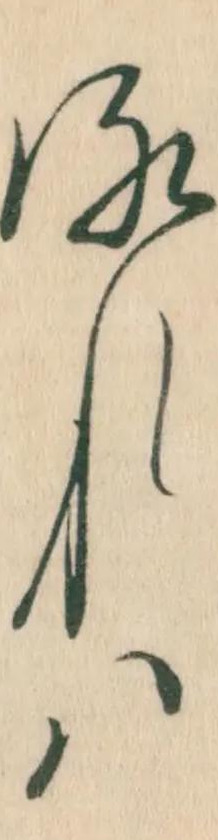るれは
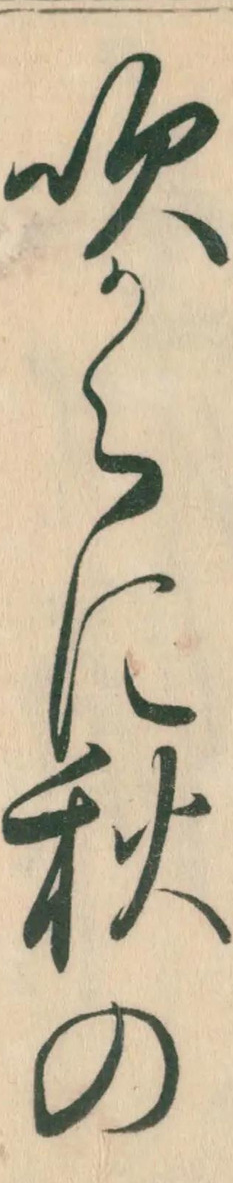吹からに秋の
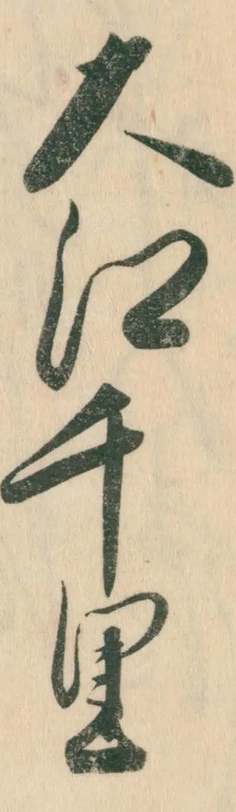大江千里
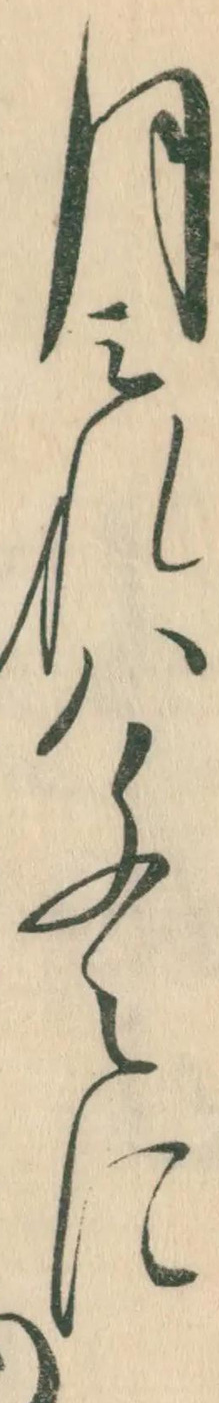月みれは千々に
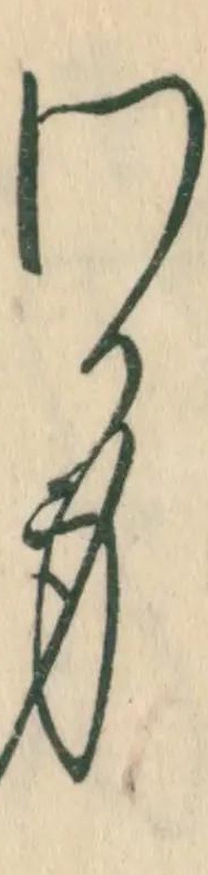わか身
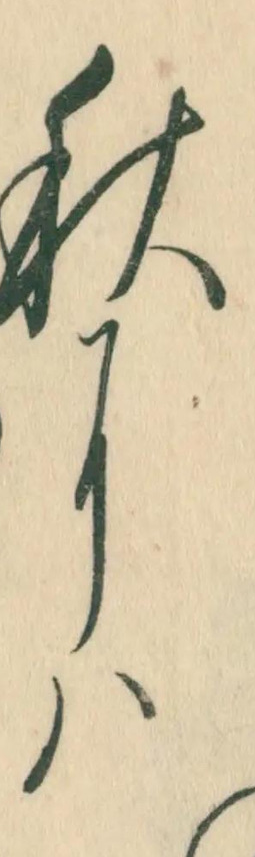秋には
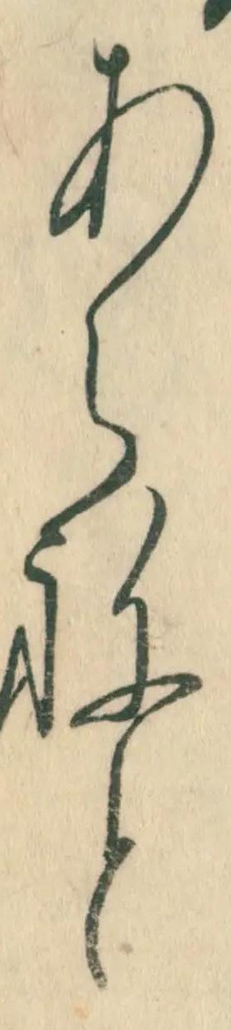あらねと

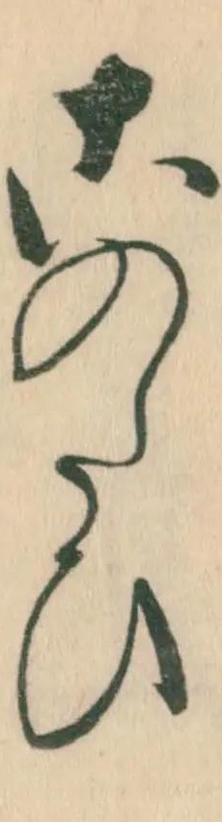このたひ
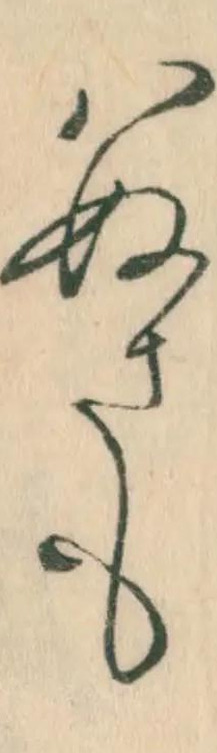はぬさも
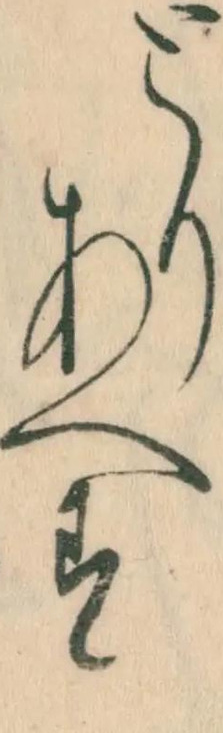あへす
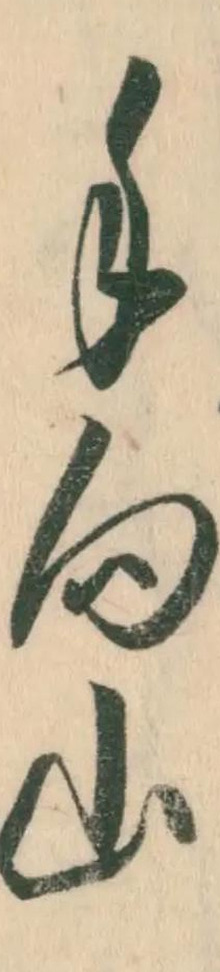手向山
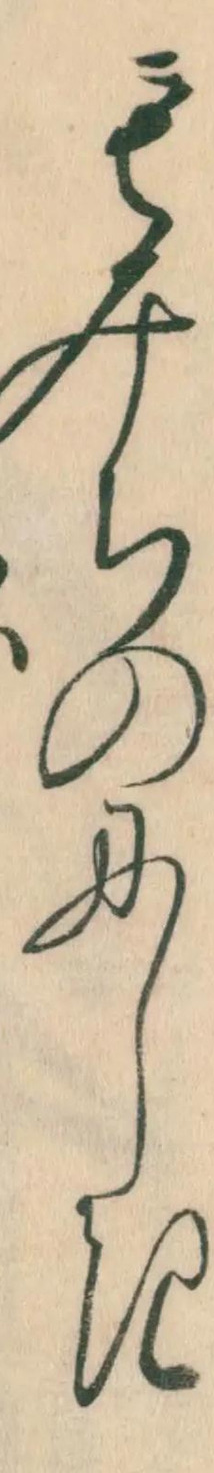もみちのにしき
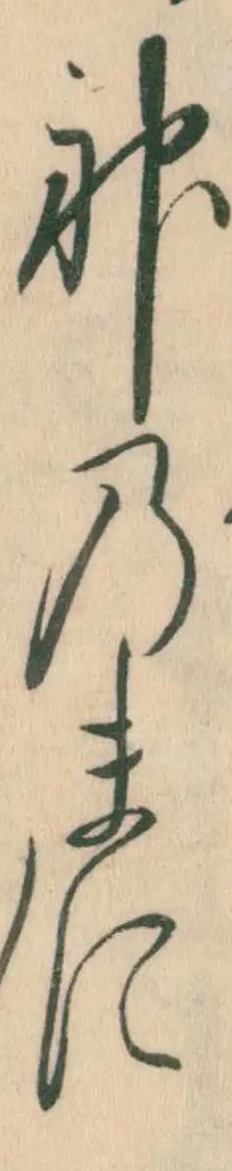神のまに
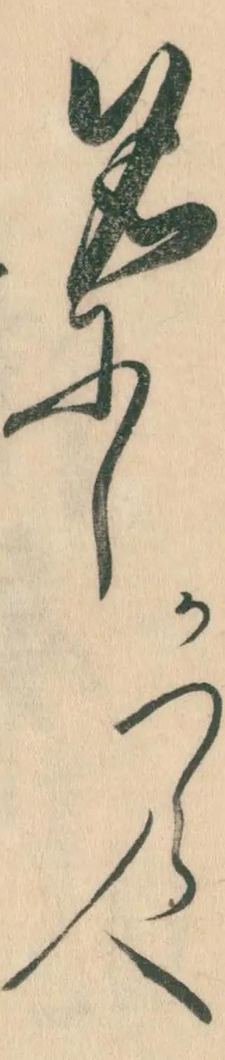名にしかつらしら
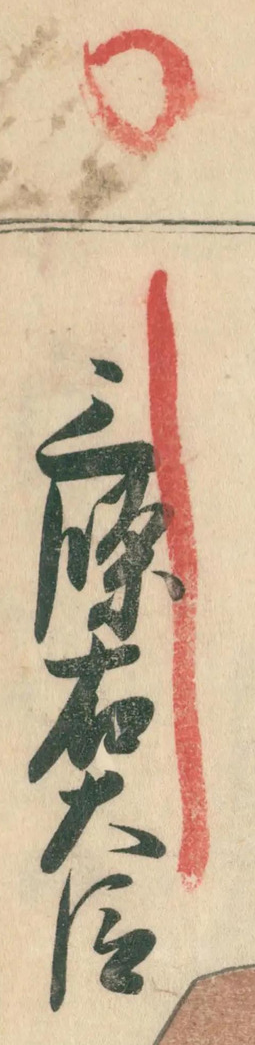三條右大臣
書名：錦百人一首あつま織
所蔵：国立国会図書館 National Diet Library, JAPAN
